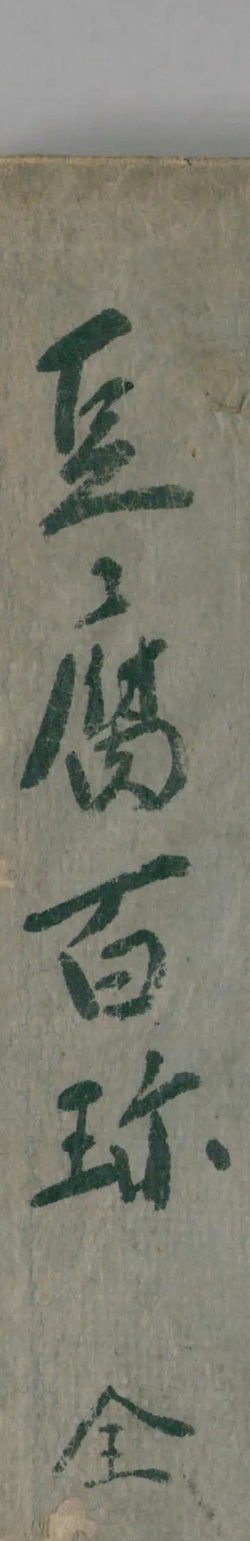豆腐百珍全

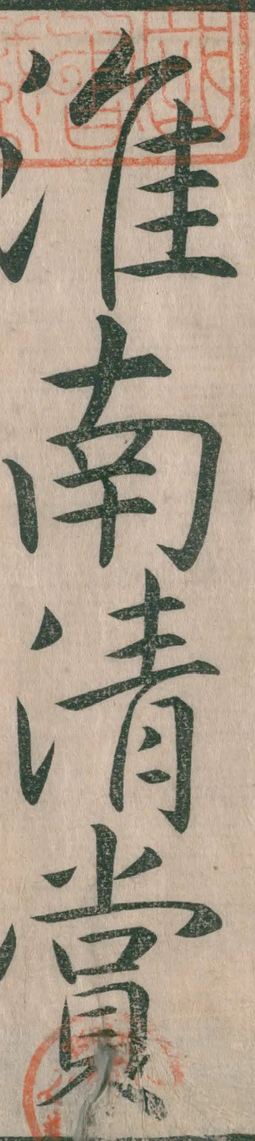淮南清賞
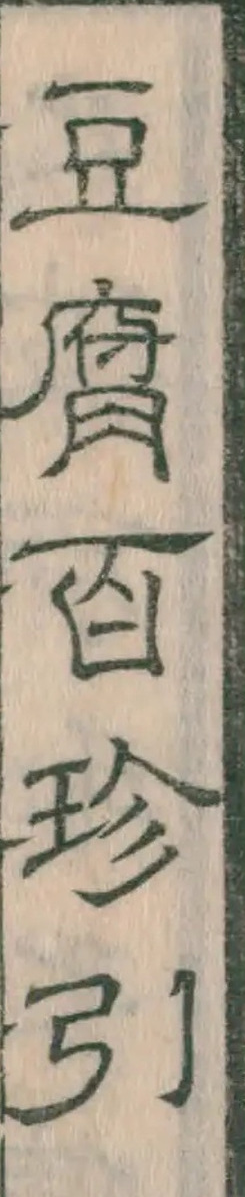豆腐百珍引
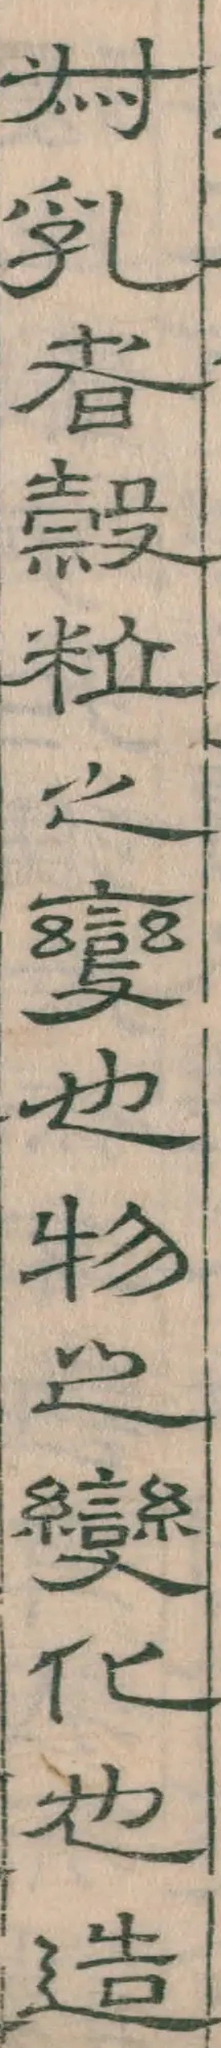叔乳者穀粒之変也物之変化也造
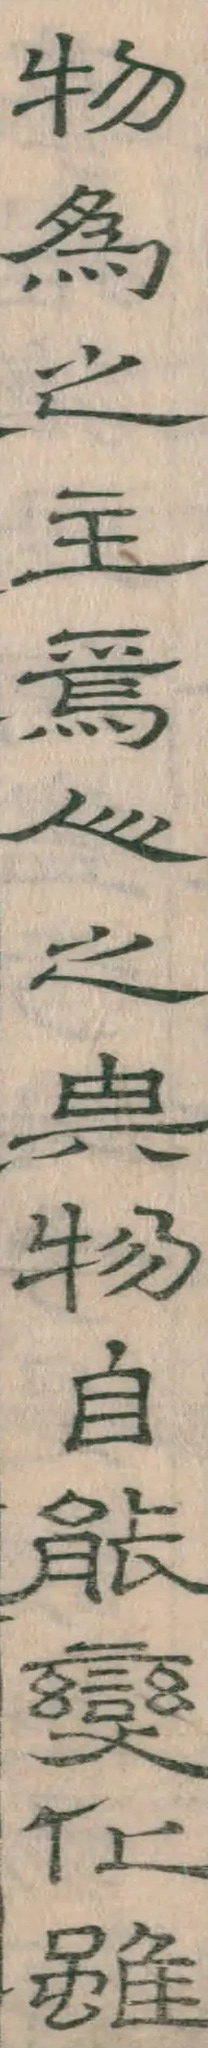物為之主焉人之異物自能変化雖
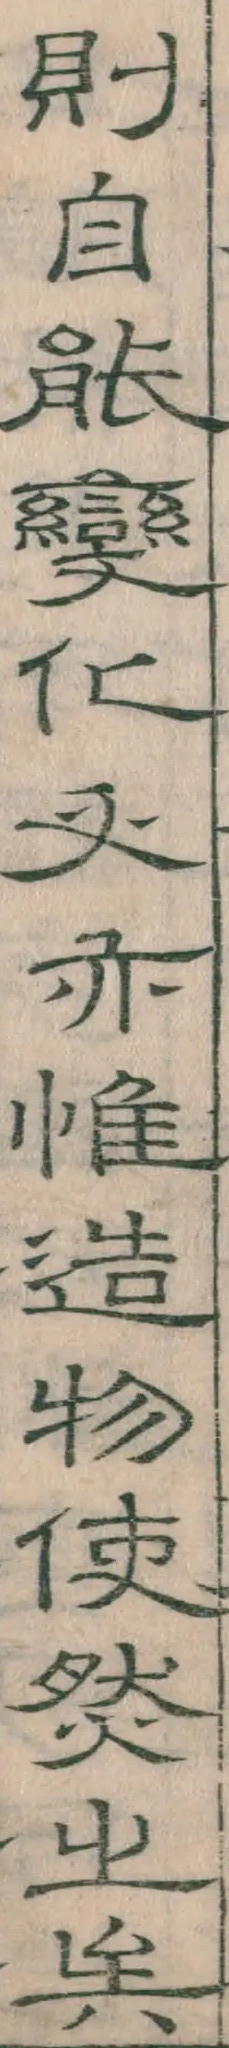則自能変化必亦惟造物使然之矣
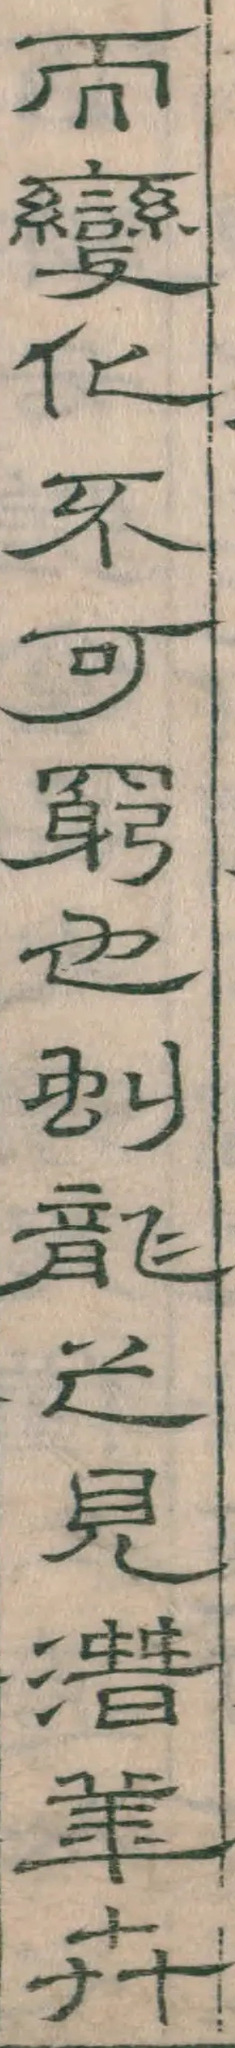而変化不可窮也虯竜之見潜華卉
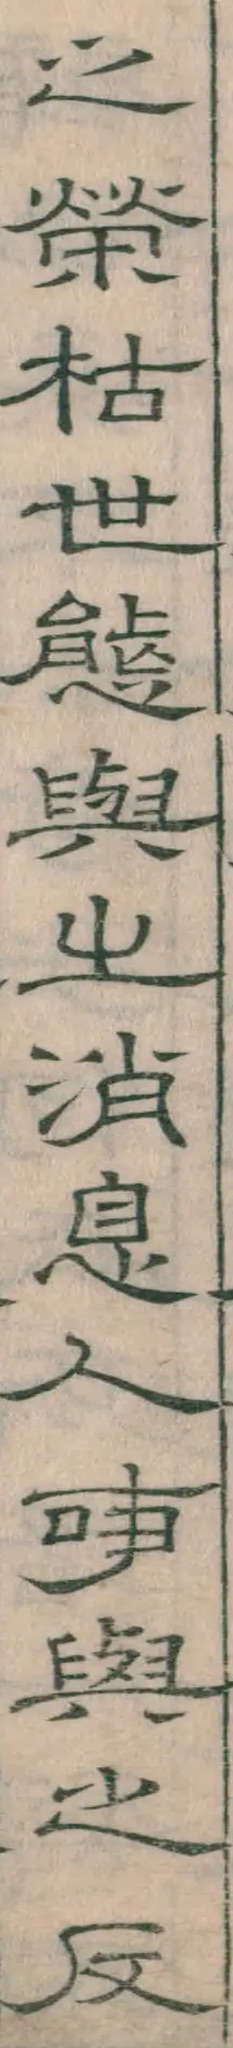之栄枯世態与之消息人事与之反
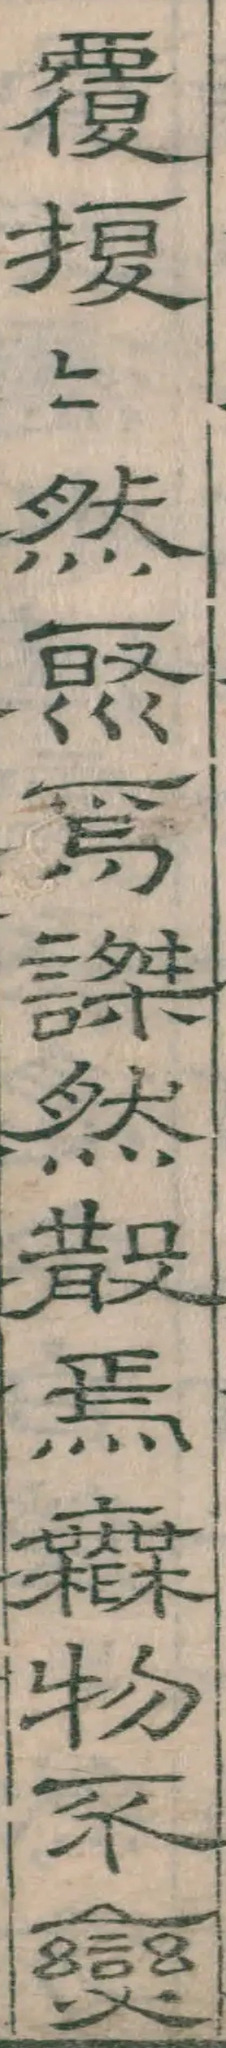覆復々然聚焉謋然散焉無物不変
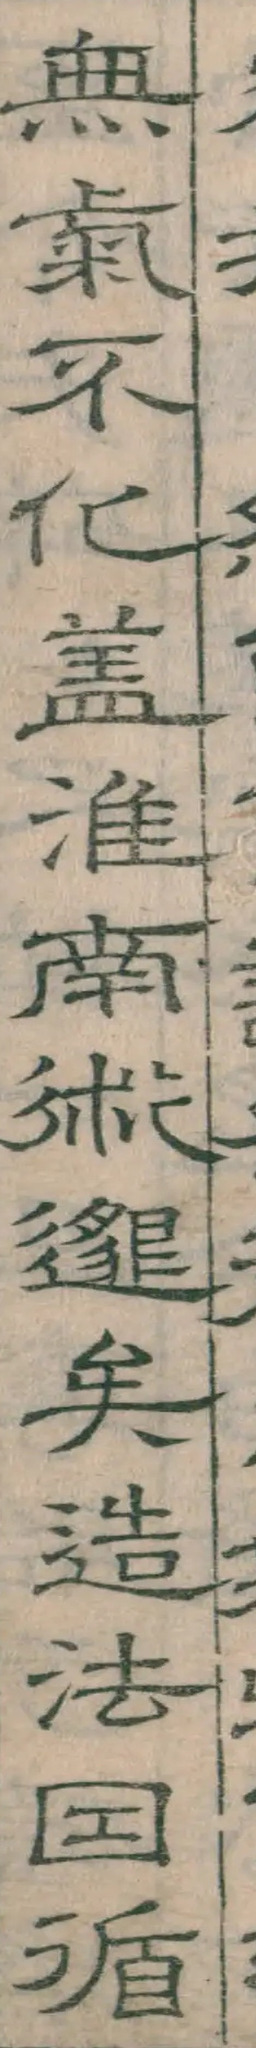無気不化蓋淮南術遥矣造法因循

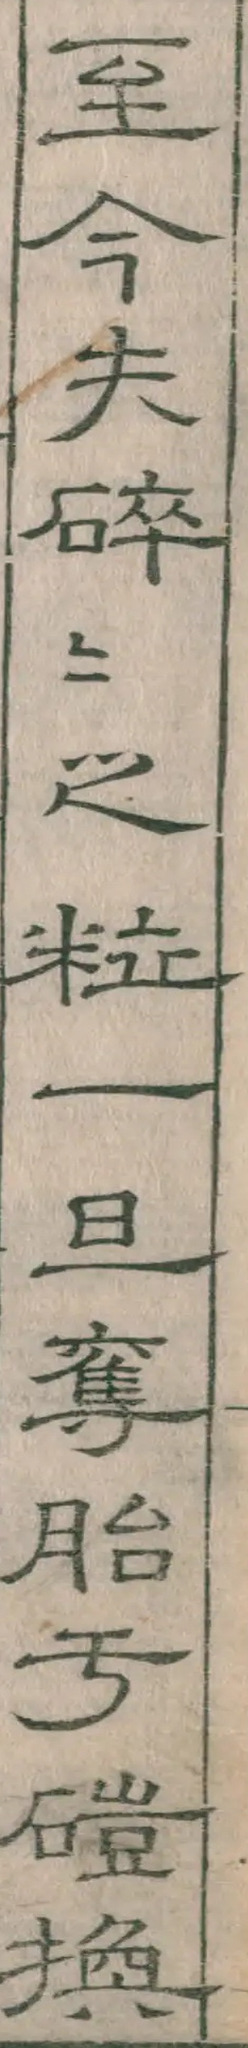至今夫碎々之粒一旦奪胎于磑換
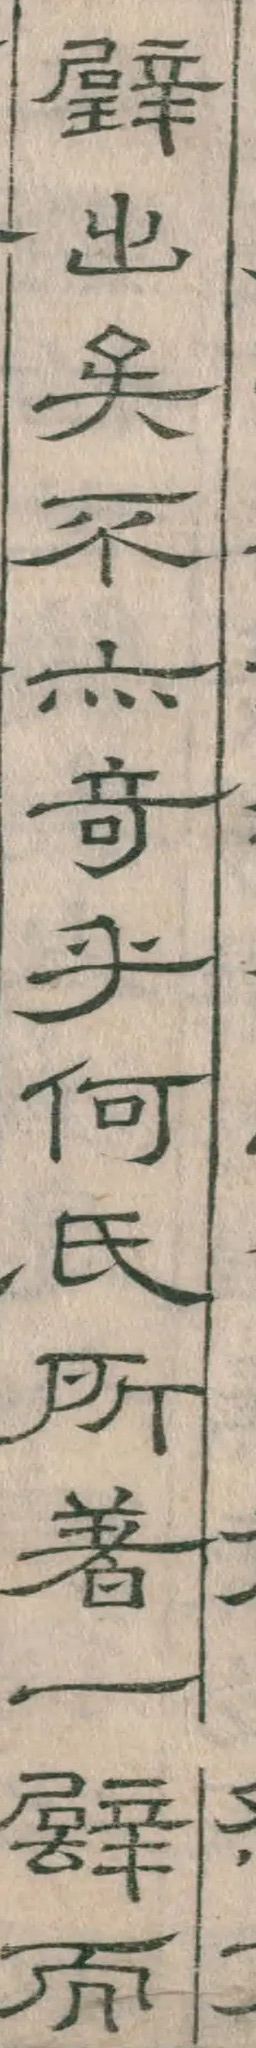璧出矣不亦奇乎何氏所著一璧而
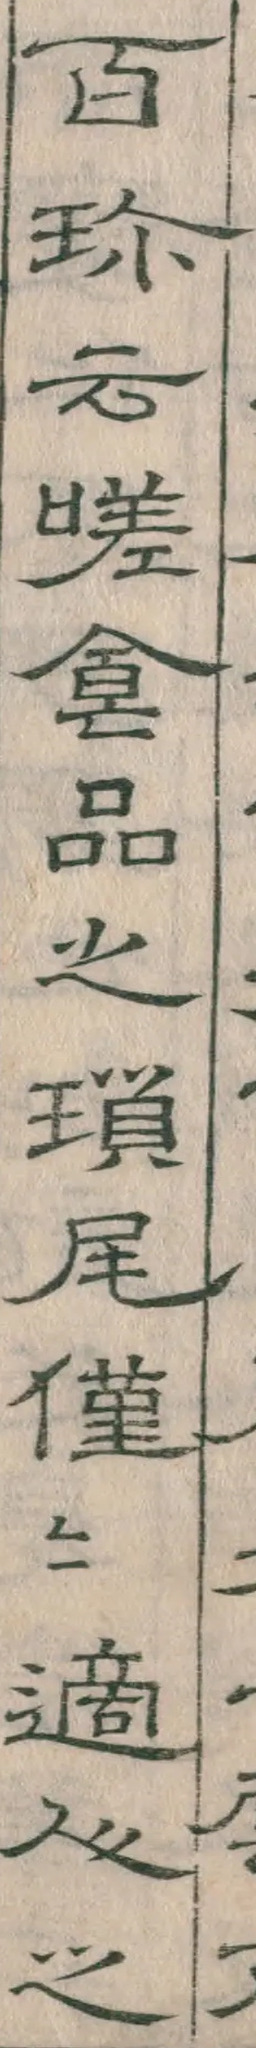百珍云嗟食品之瑣尾僅々適人之
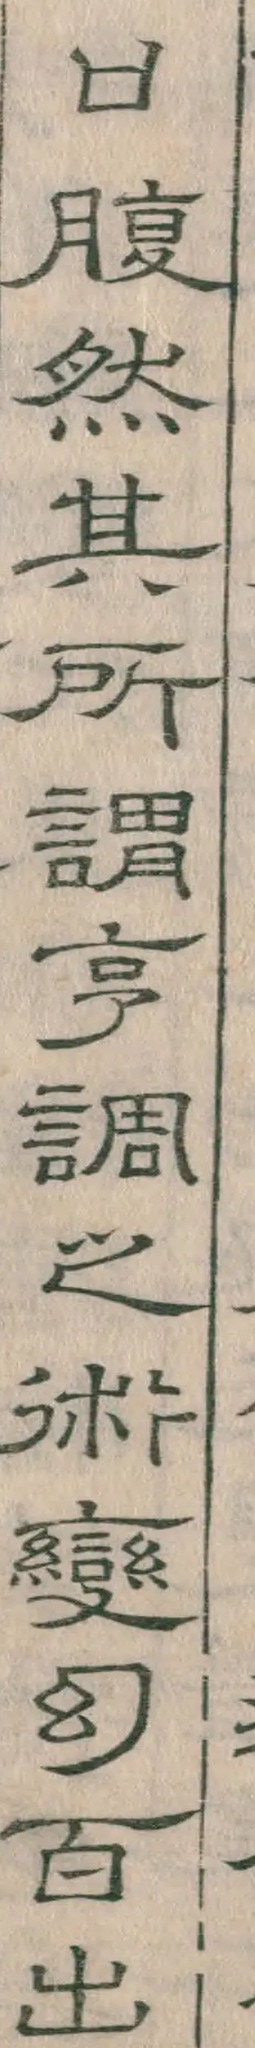口腹然其所謂亨調之術変幻百出
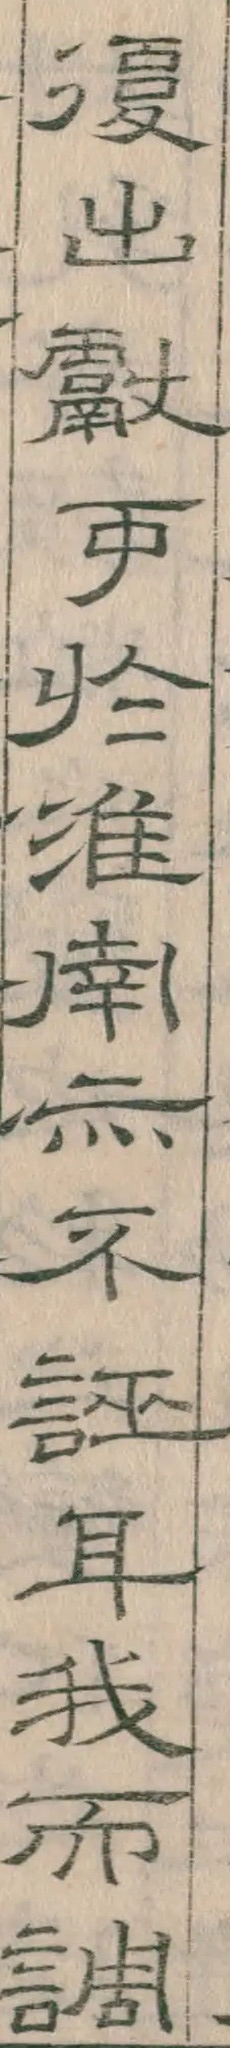復出献於淮南亦不誣耳我而調
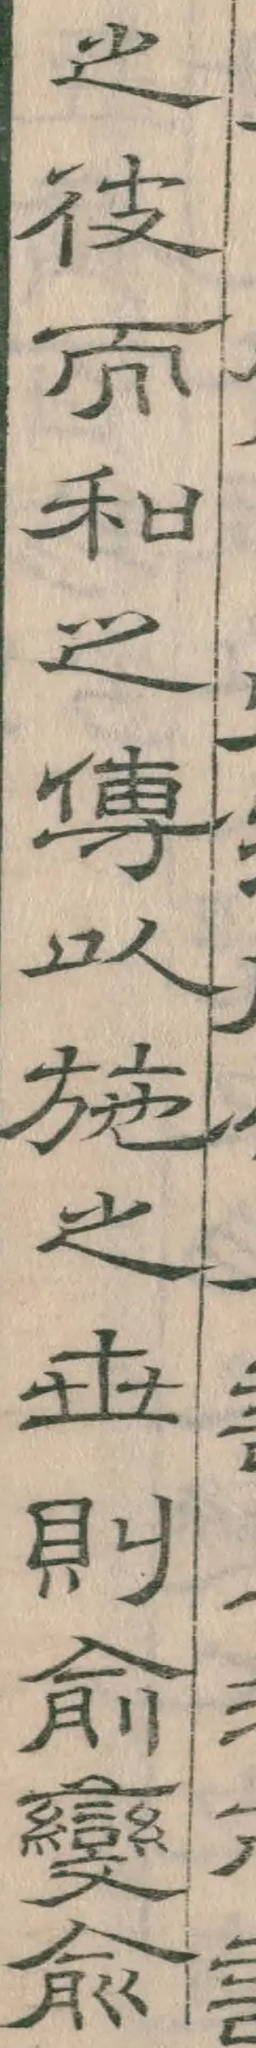之彼而和之伝以施之世則兪変兪
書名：豆腐百珍. [正編]
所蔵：国立国会図書館 National Diet Library, JAPAN
